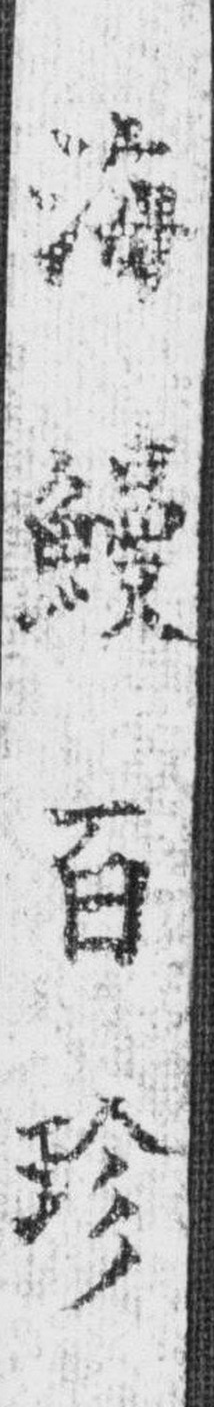海鰻百珍
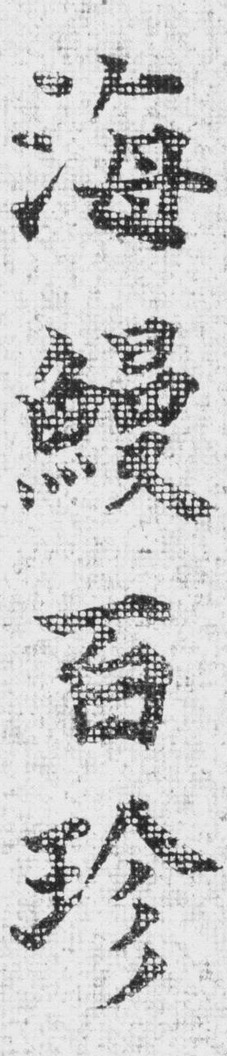海鰻百珍

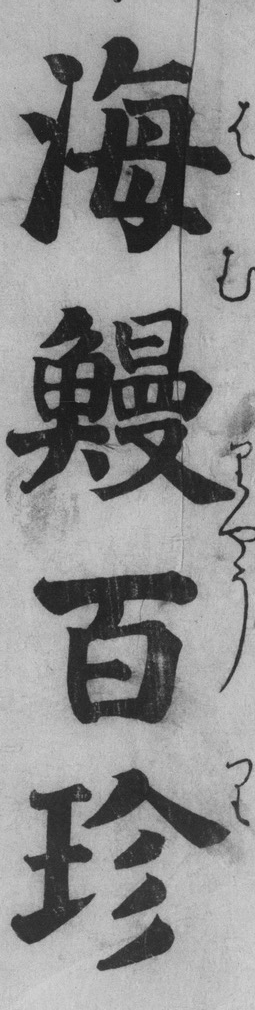海鰻百珍
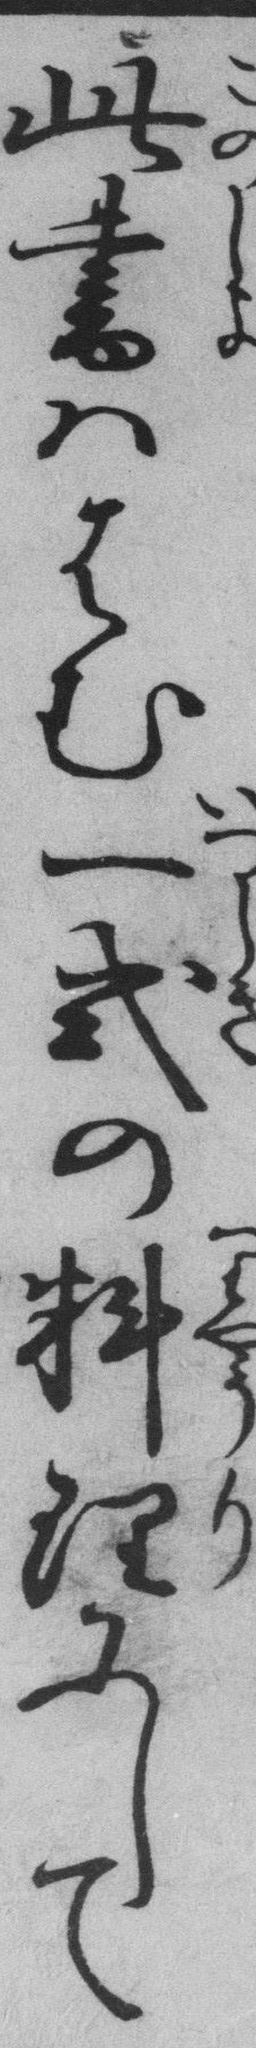此書ははむ一式の料理にして
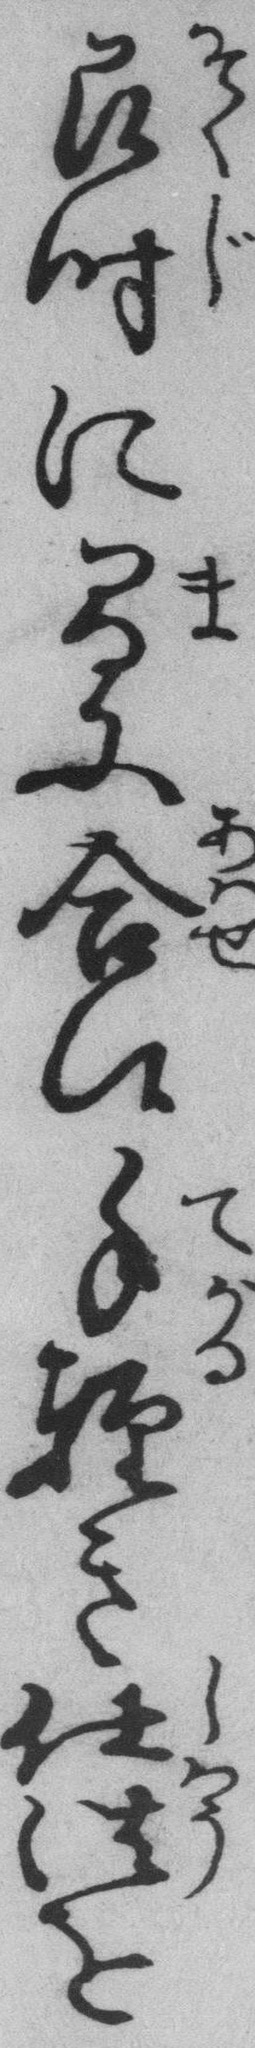即時に間に合候手軽き仕法を
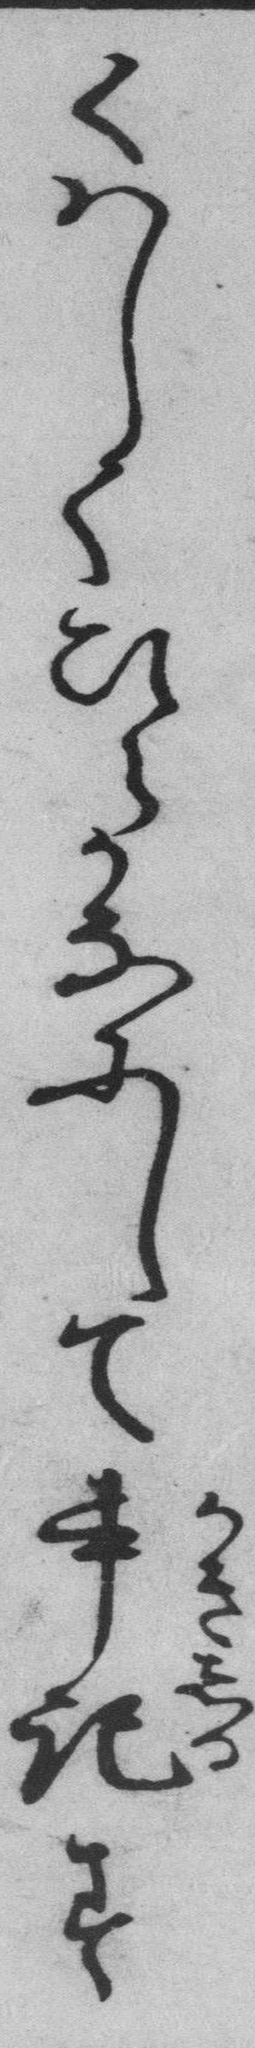くはしくひらかなふして手記す
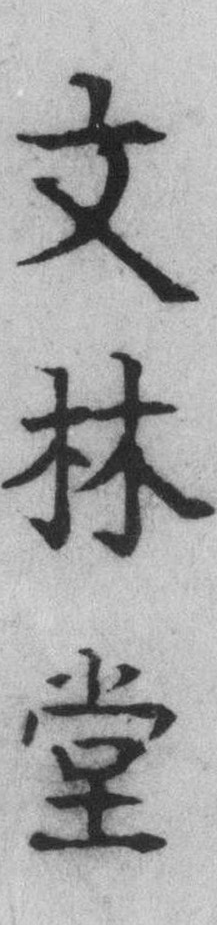文林同
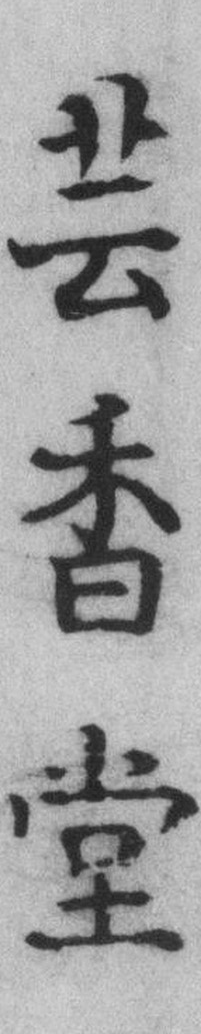芸香同
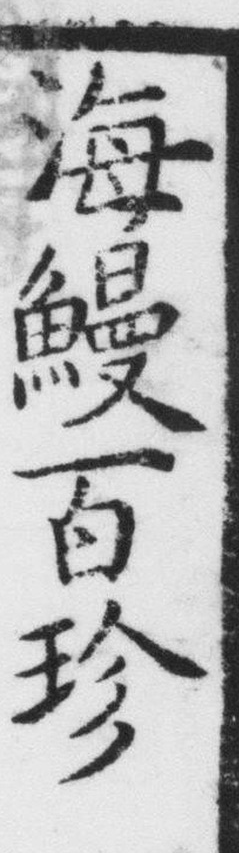海鰻百珍
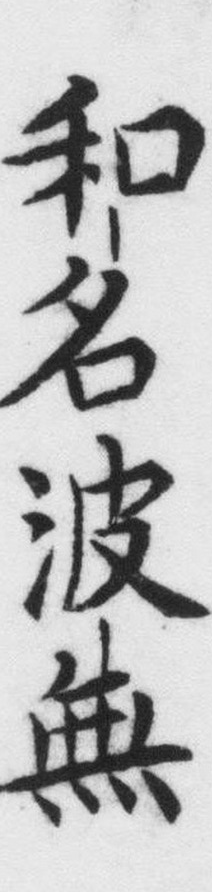和-名波-無
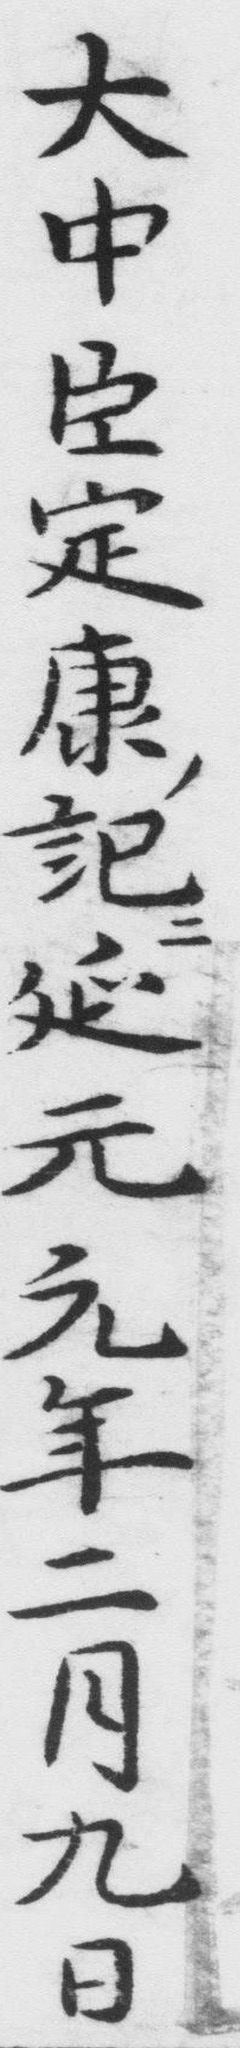大中臣定康記延元元年二月九日
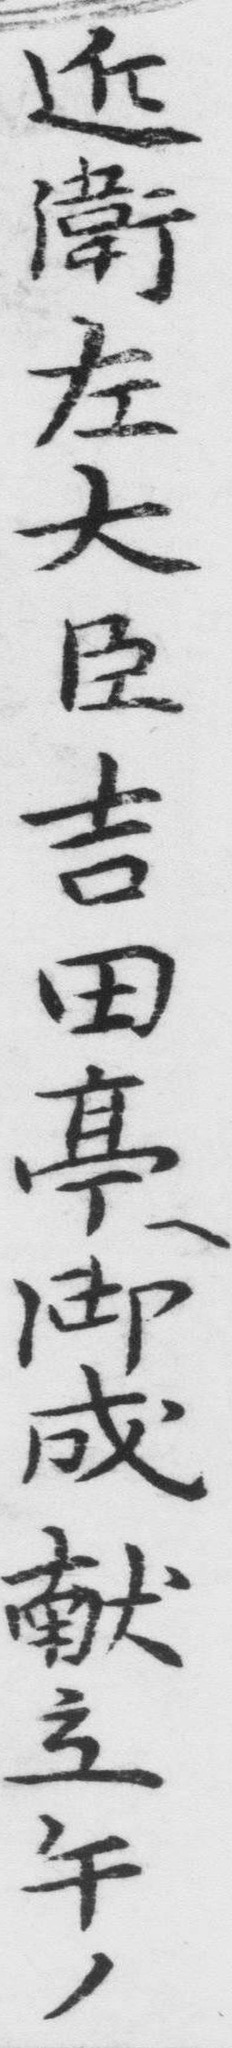近衛左大臣吉田亭御成献立午ノ

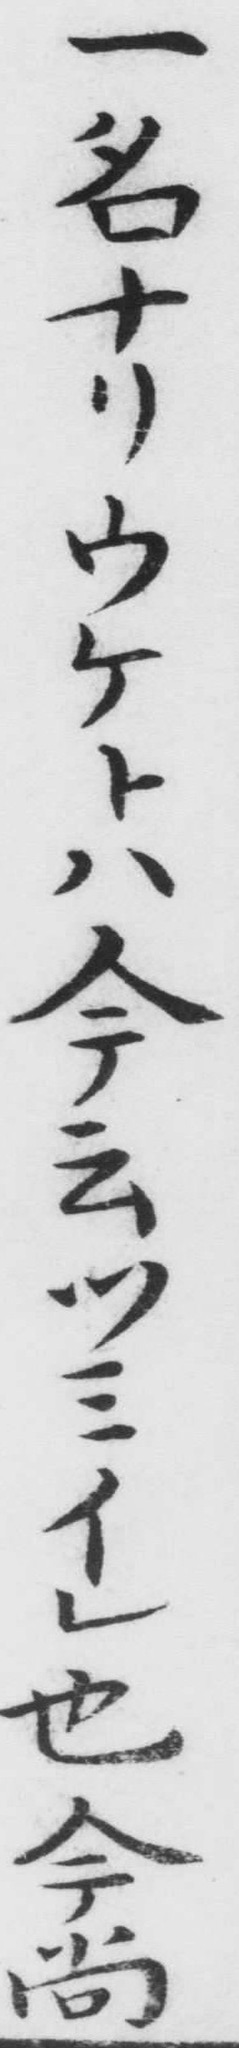一名ナリウケトハ今云ツミイレ也今尚
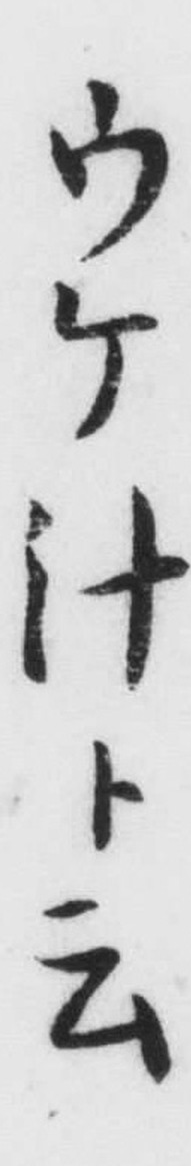ウケ汁ト云
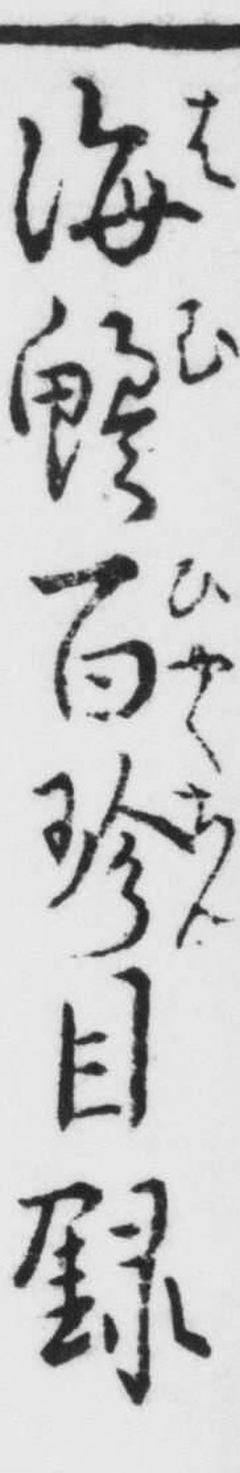海鱧百珍目録

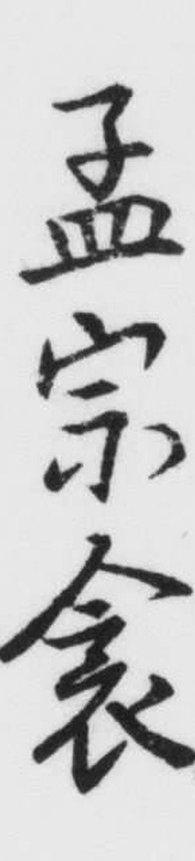孟宗衾
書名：海鰻百珍
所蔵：大阪府立大学学術情報センター 国文学研究資料館
